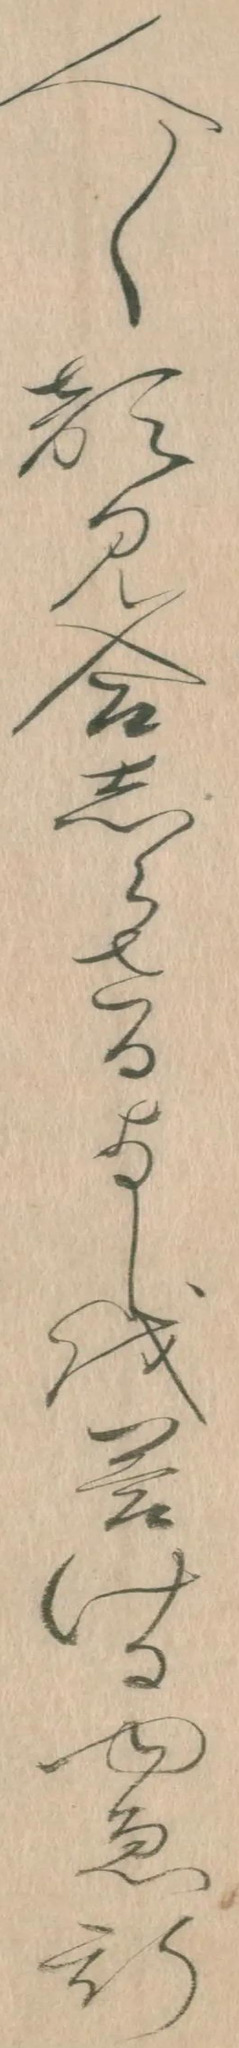人〳〵顔見合しらさるよしを答けるゆゑ斯
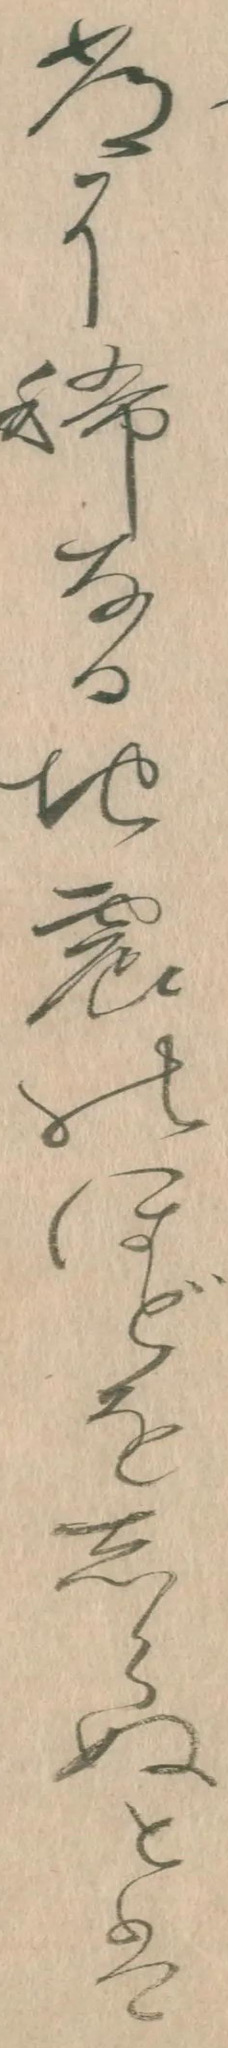常に稀なる地震のほどをしらぬとは
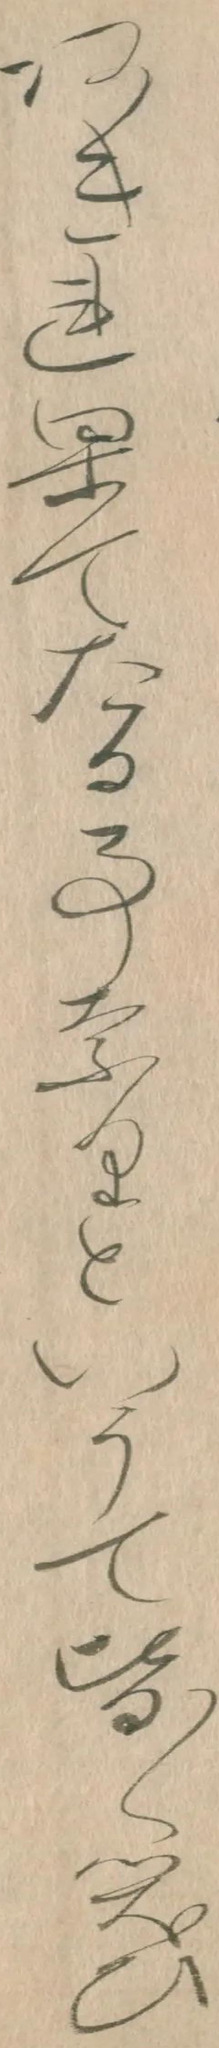あきれ果てたる事なりというて皆〳〵笑ひ
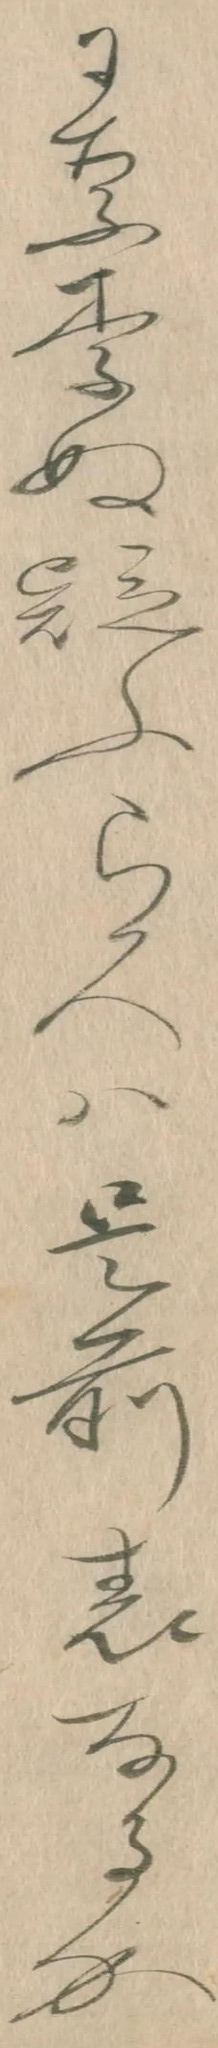になりぬ疑ふらくは是前表なるか
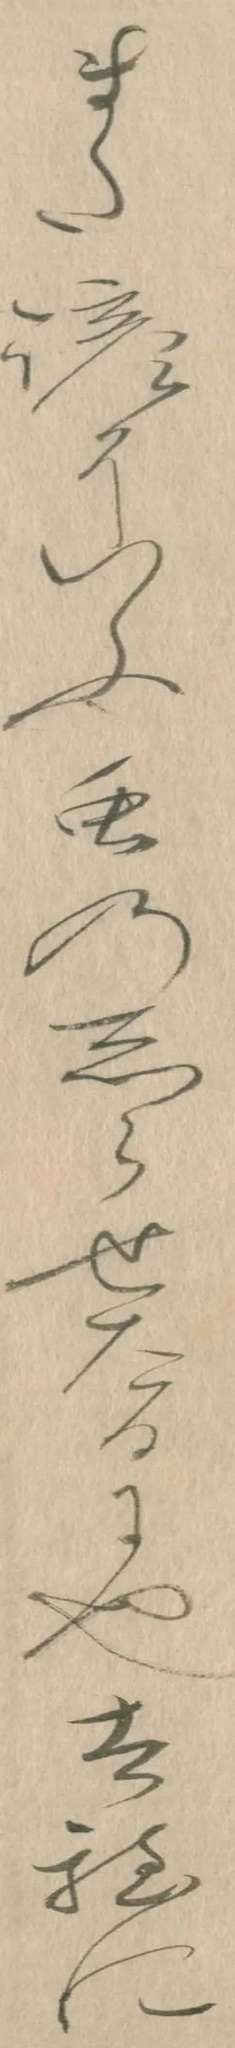また諺にいふ虫のしらせたるにや去程に
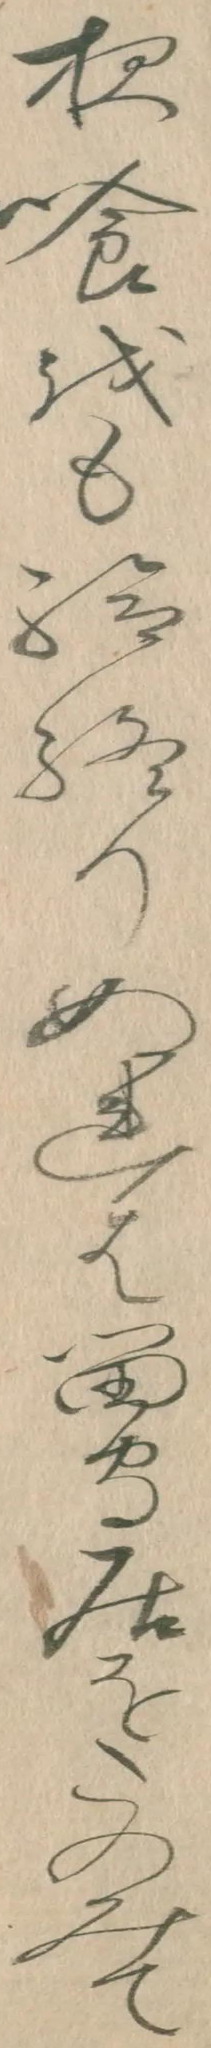夜喰をも給終りぬれは留守居をたのみて
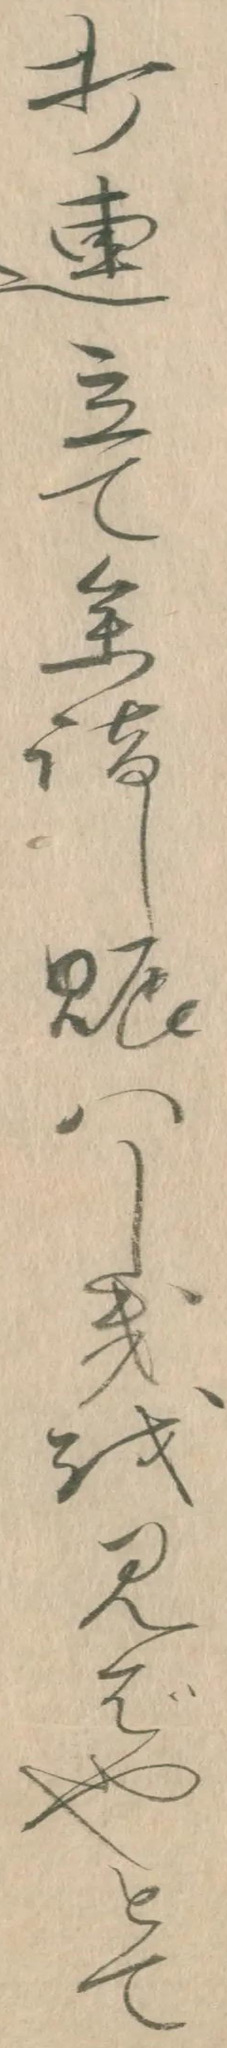打連立て参詣し賑はしきを見ばやとて
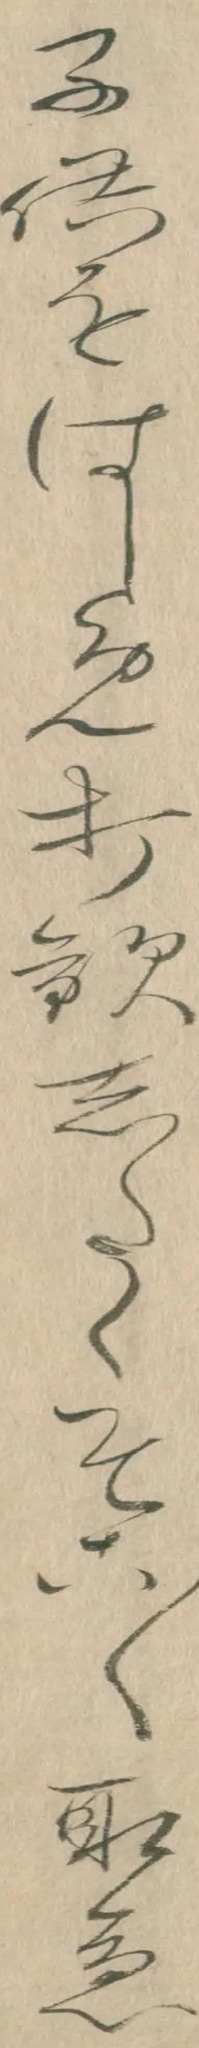子供をはしめ打歓したくそこ〳〵取急

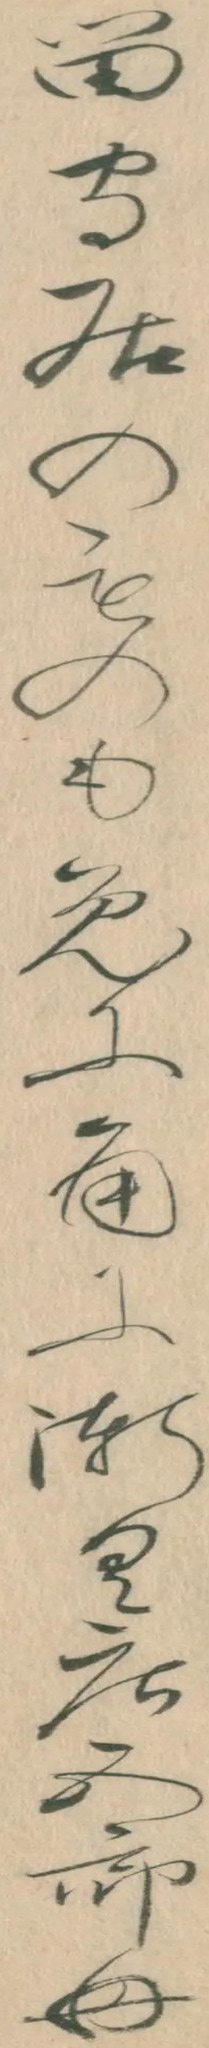留守居のものも兎に角に漸く店五郎母
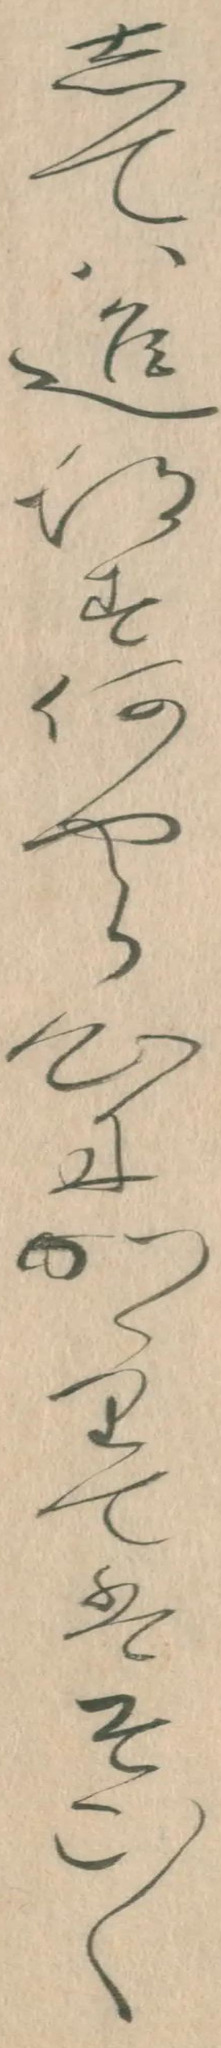しては進得す何やら心にかゝりてはそこ〳〵
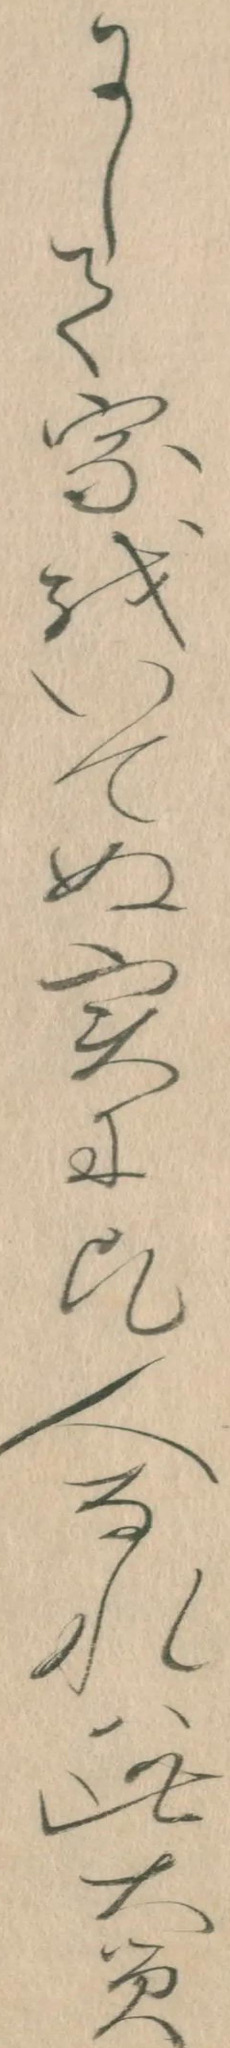にして家をいてぬ実に凡人なれは此大災
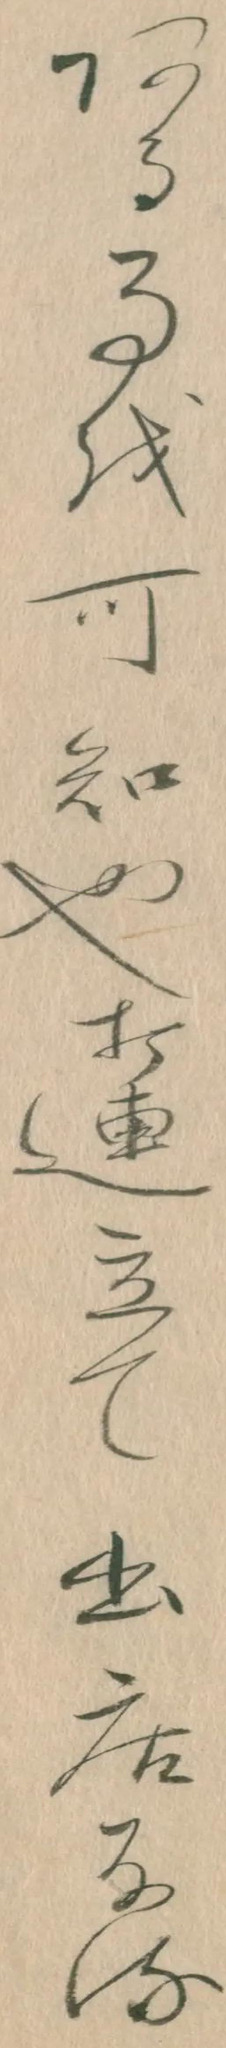ある事を可知や打連立て出店なる
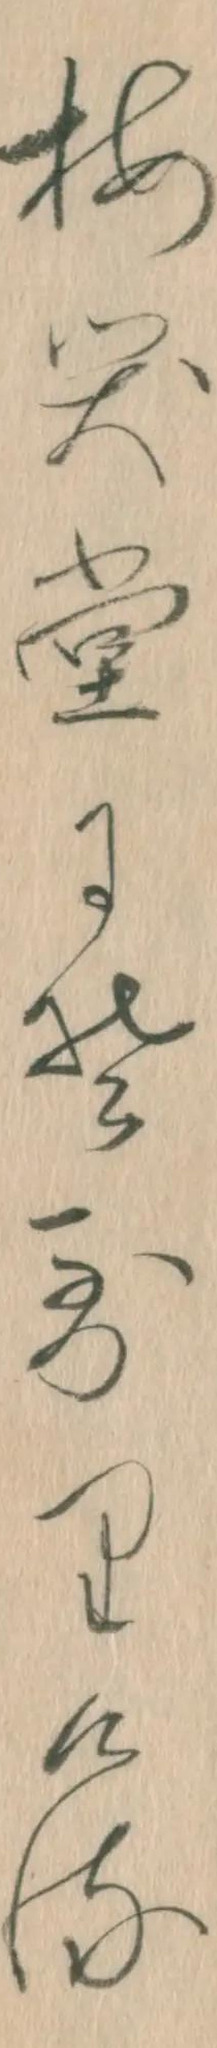梅笑堂にそ至りける
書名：俗語之種. [2]
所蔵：国立国会図書館 National Diet Library, JAPAN
